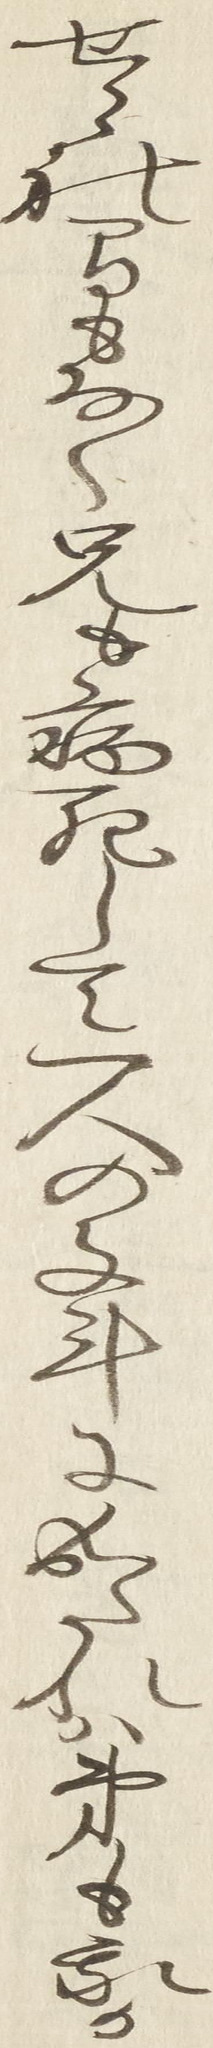せられ間もなく兄も病死して一人の子斗に成たれは弟も我か
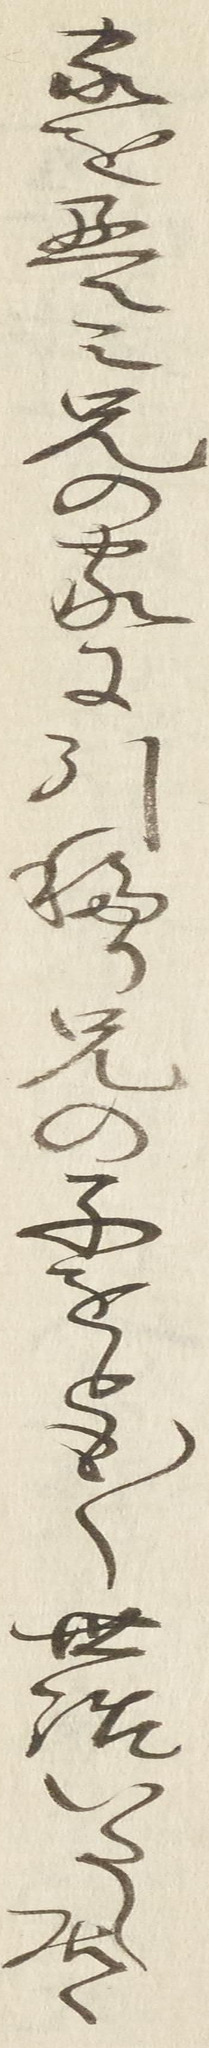家を畳み兄の家に引移り兄の子をとも〳〵世話いたし居候
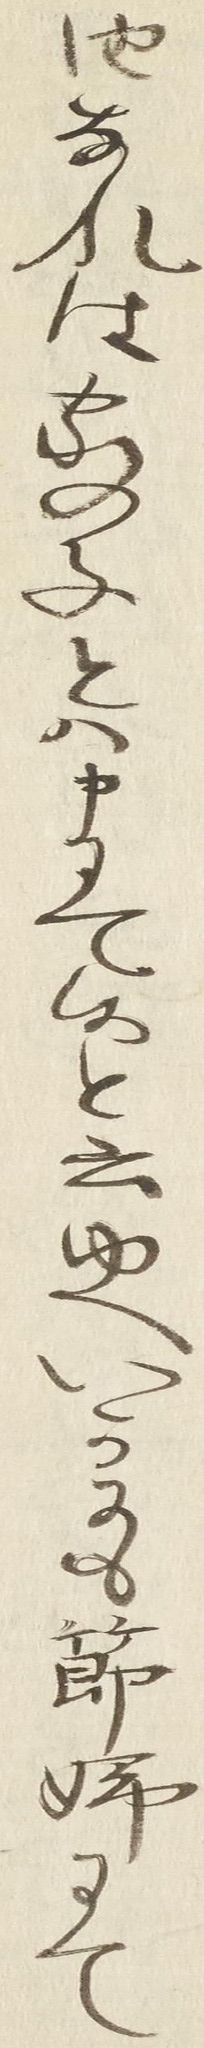由なれは家の子とは申にて候と云ゆへいかにも節婦にて
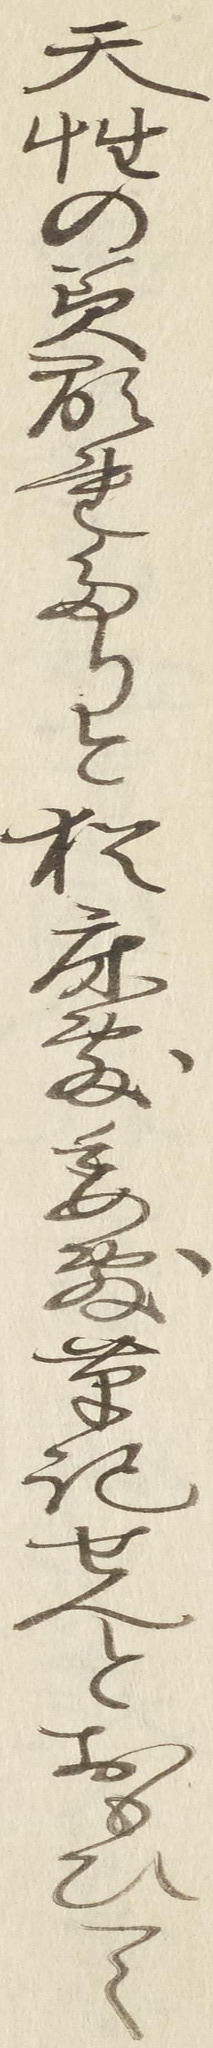天性の美顕れたりと猶床敷委敷筆記せんとおもひて
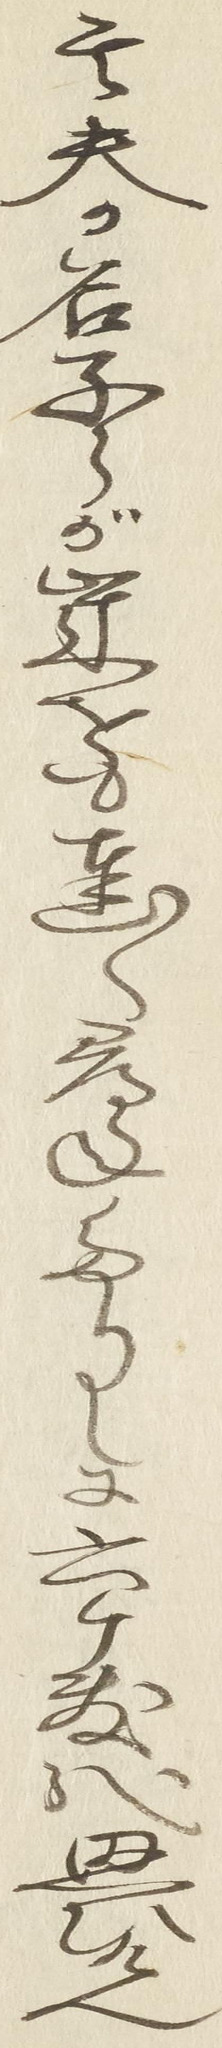其夫か各子らが歳をも連尋ねたりしに六ケ敷哉思ひけん
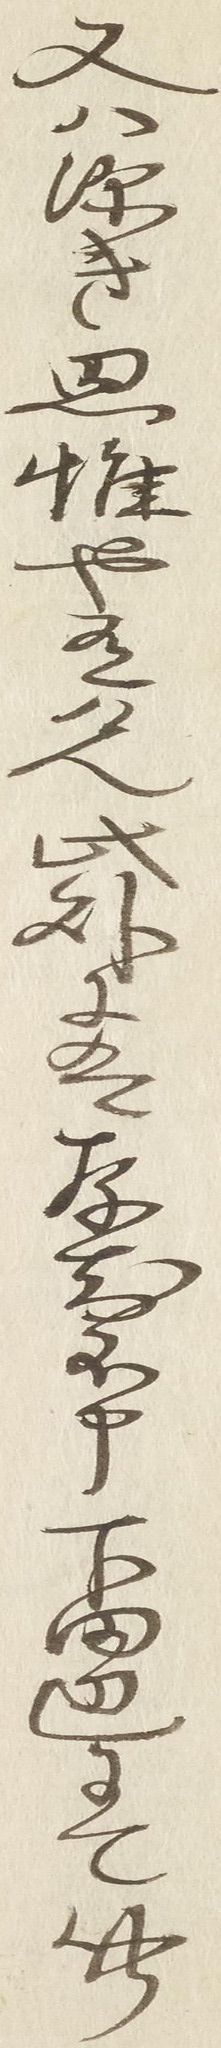又は深き思惟や有けん此外に右存知不申下田辺にて聞
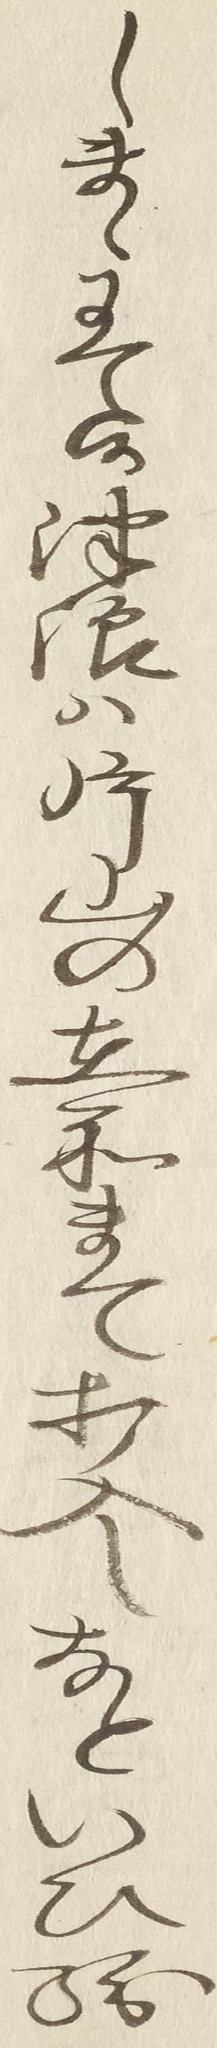しまゝにて候津浪は片山の在所まて打入しなといひ紛
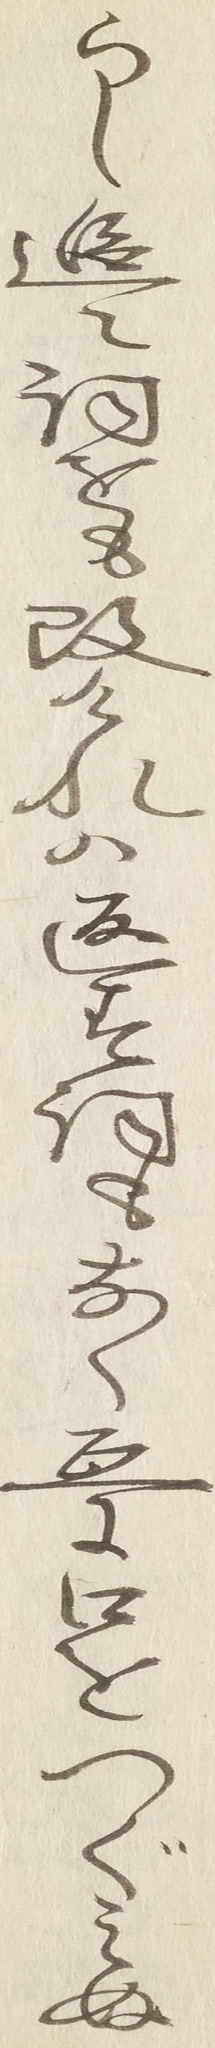らし追々詞をも改めけれは返す詞もなく互に口をつぐみぬ
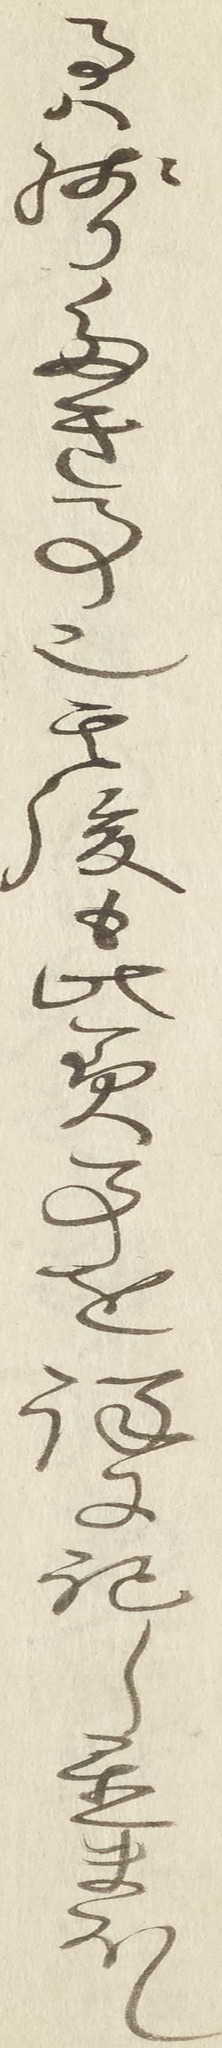事は残りたき事也其後も此美事を詳に記し置まほし
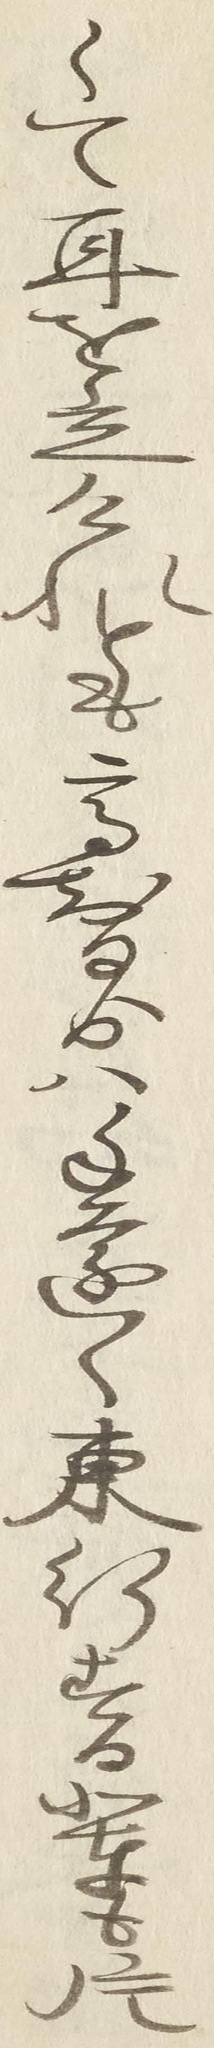くて耳を立けれとも高知るよりは手遠く東行する輩も片
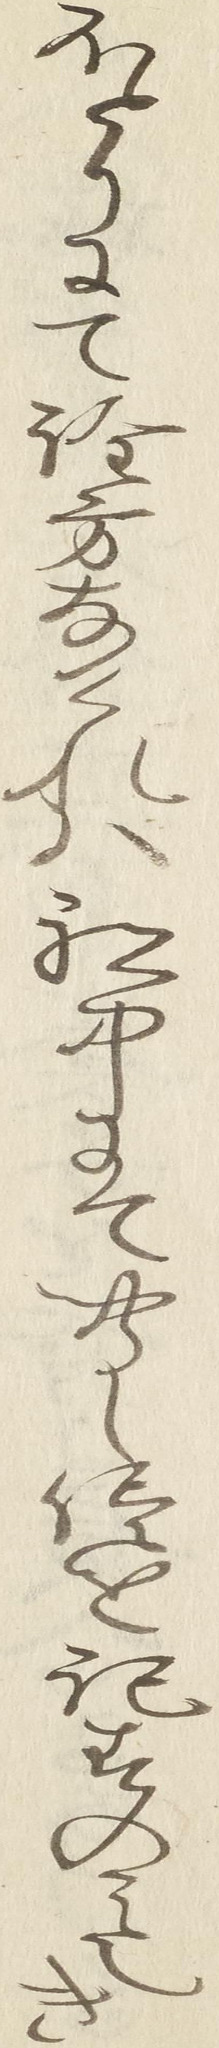ほとりにて詮方なけれは船中にて聞し侭を記すのみ也き
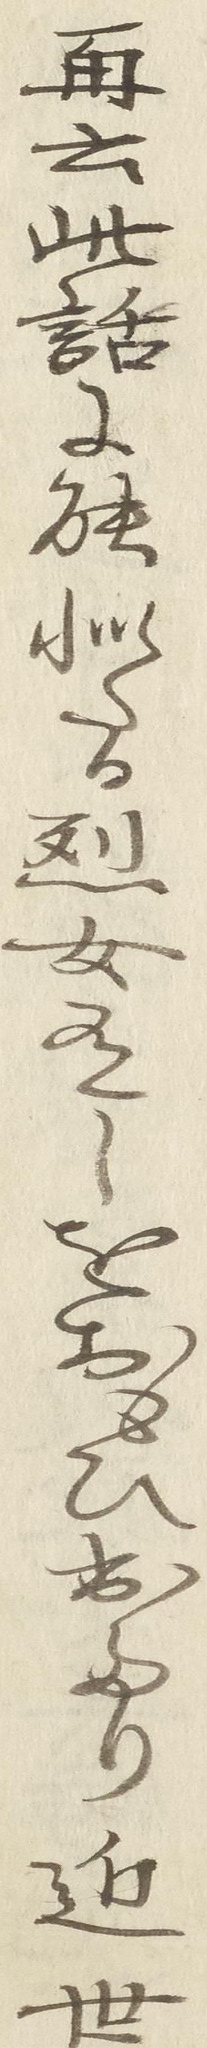再云此話に能似たる烈女有しをおもひ出たり近世
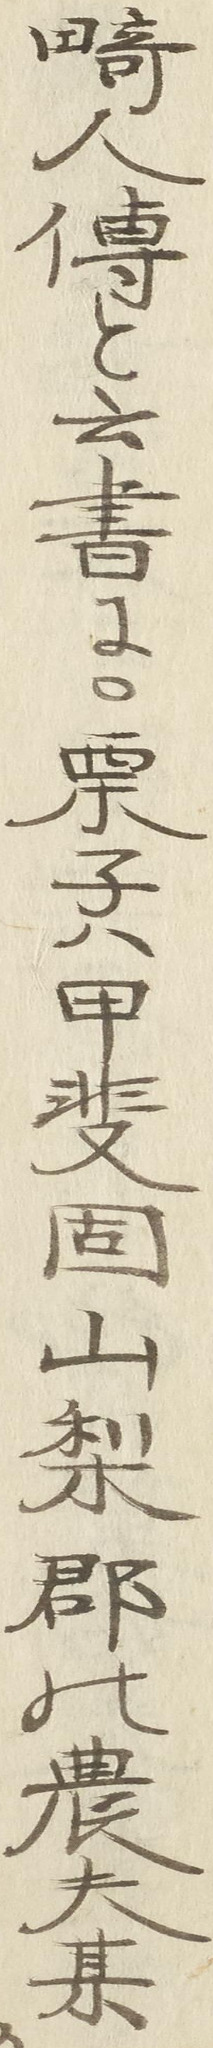畸人伝と云う書に◦栗子は甲斐固山梨郡の農夫某か

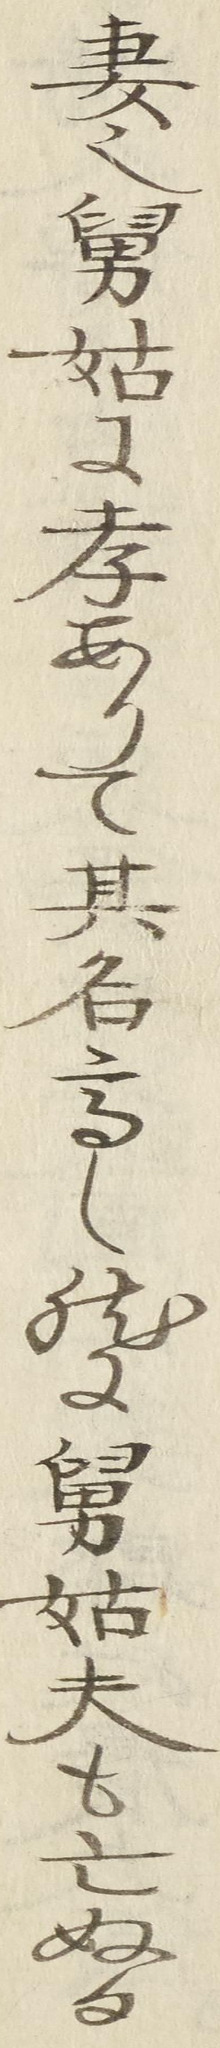妻也舅姑に孝ありて其名高し然に舅姑夫も亡ぬる
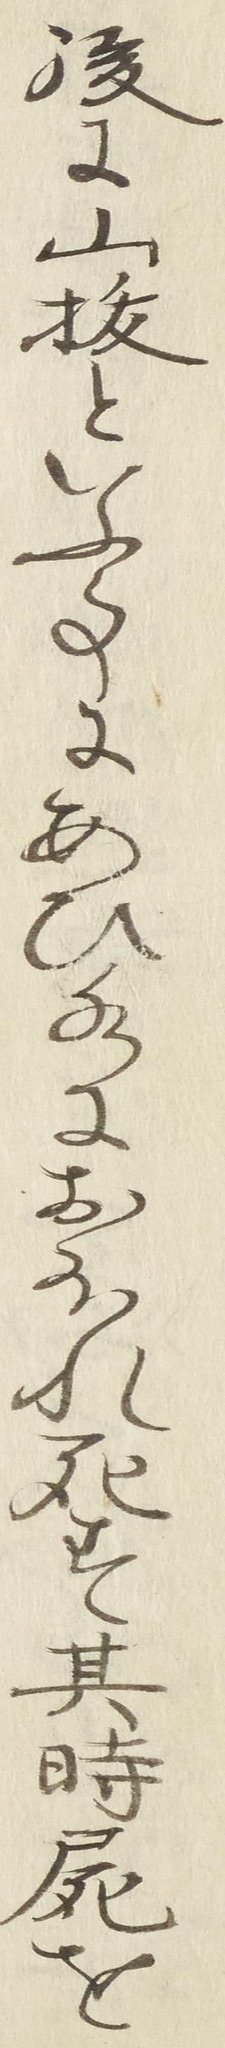後に山抜といふ事にあひ水におほれ死す其時屍を
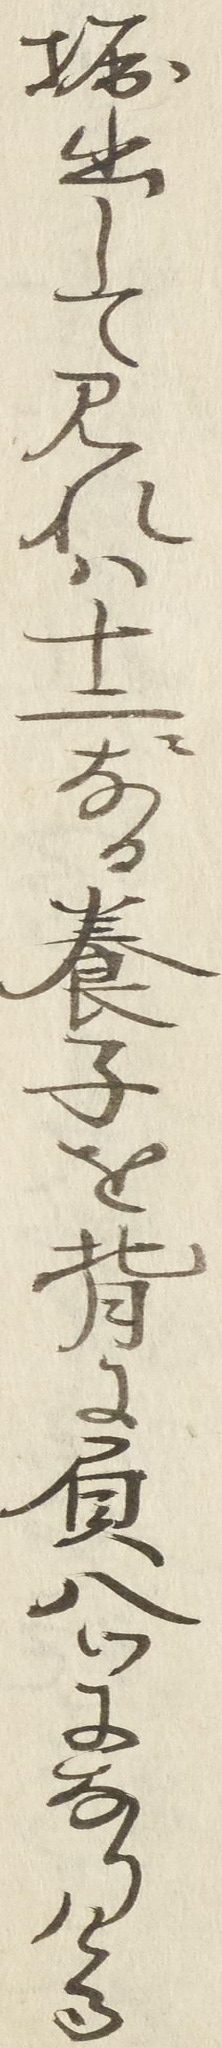掘出して見れは十二になる養子を背に負八つになりける
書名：地震記　上
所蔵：東京大学地震研究所図書室 Earthquake Research Institute Library, The University of Tokyo, JAPAN
